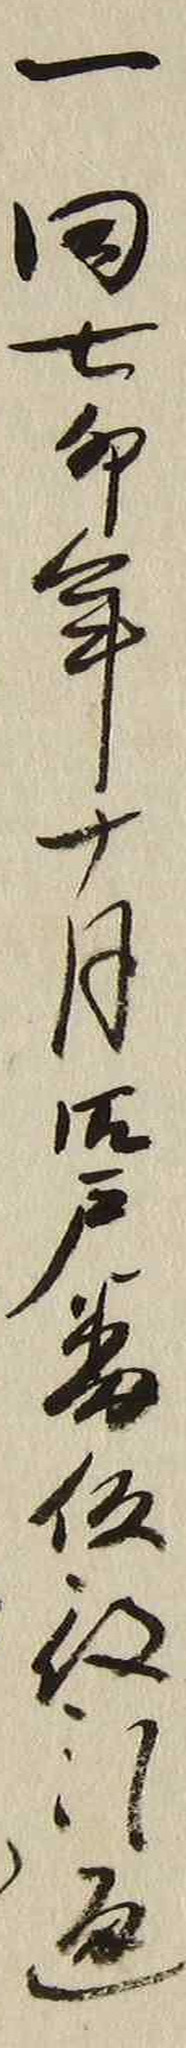一同七卯年十月御戸番仮役引通
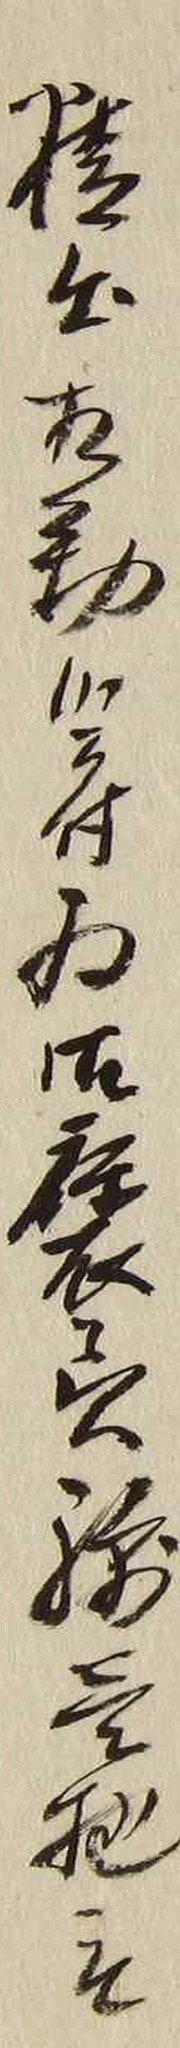精出相勤候ニ付為御褒美綿壱把被
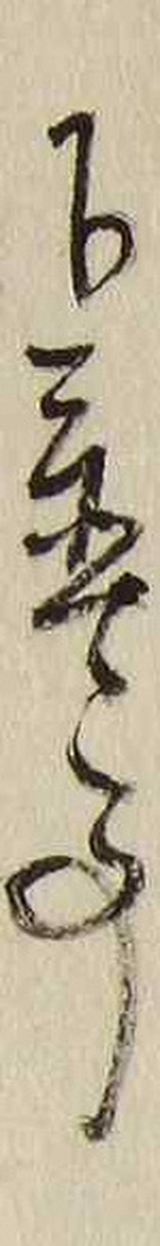下置候事
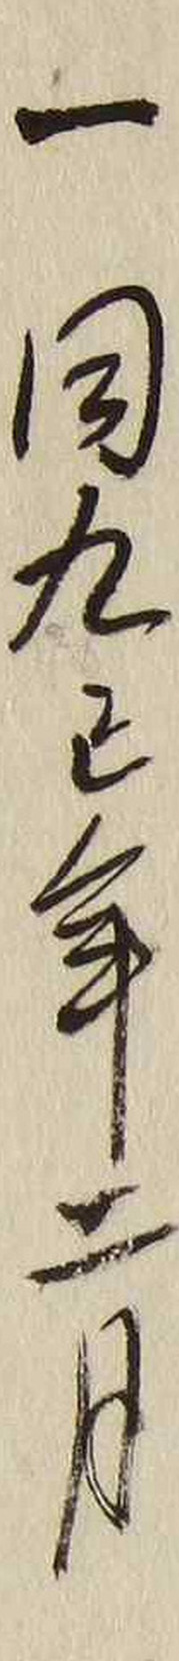一同九巳年二月

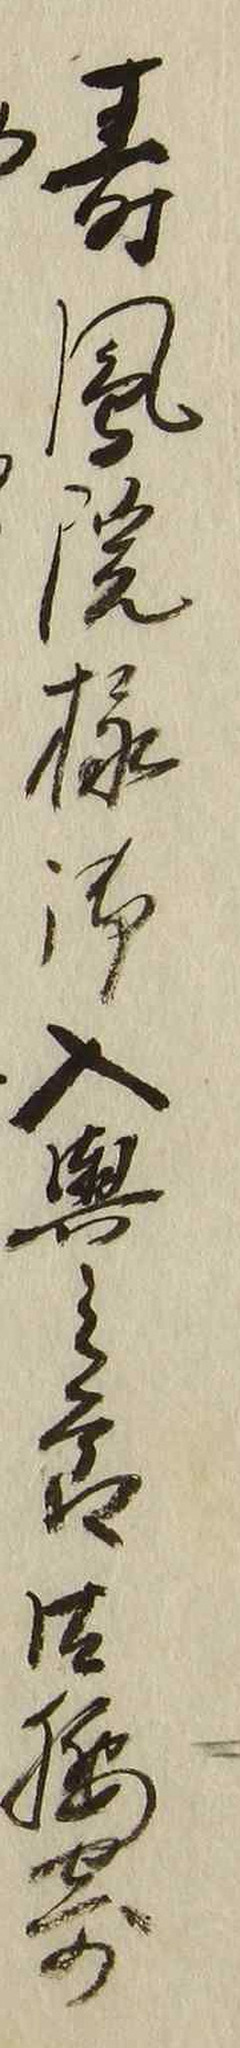寿鳳院様御入輿之節御腰寄
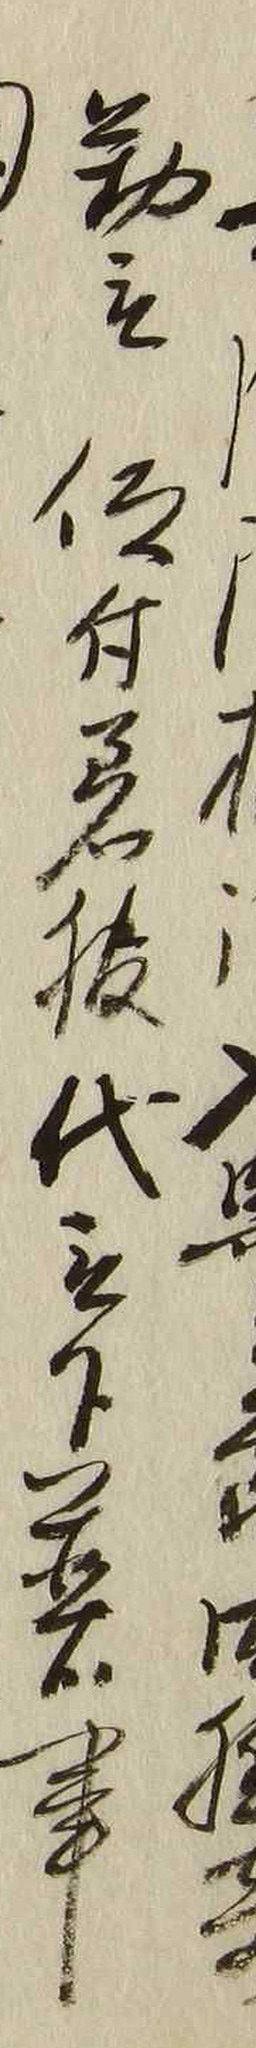勤被仰付着服代被下置候事
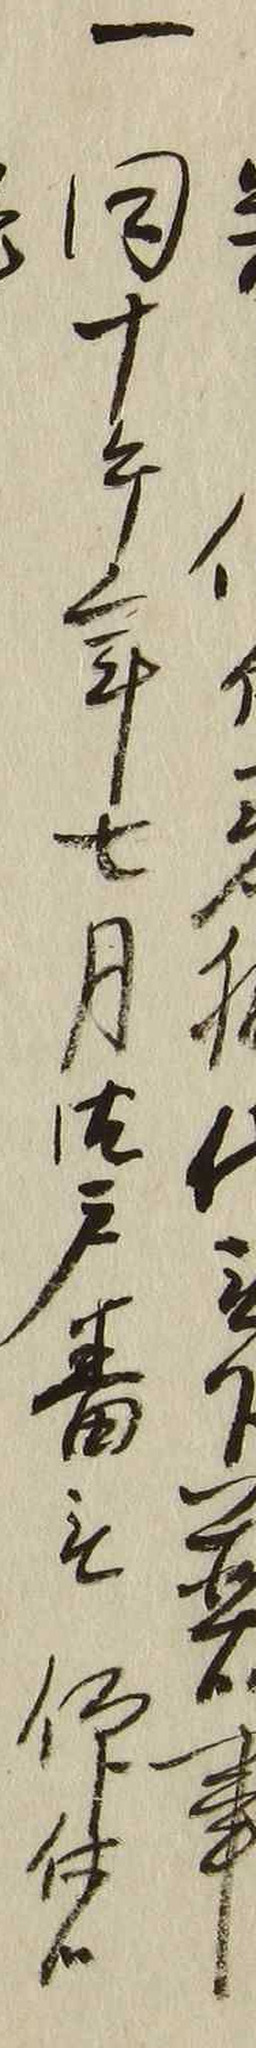一同十午年七月御戸番被仰付候
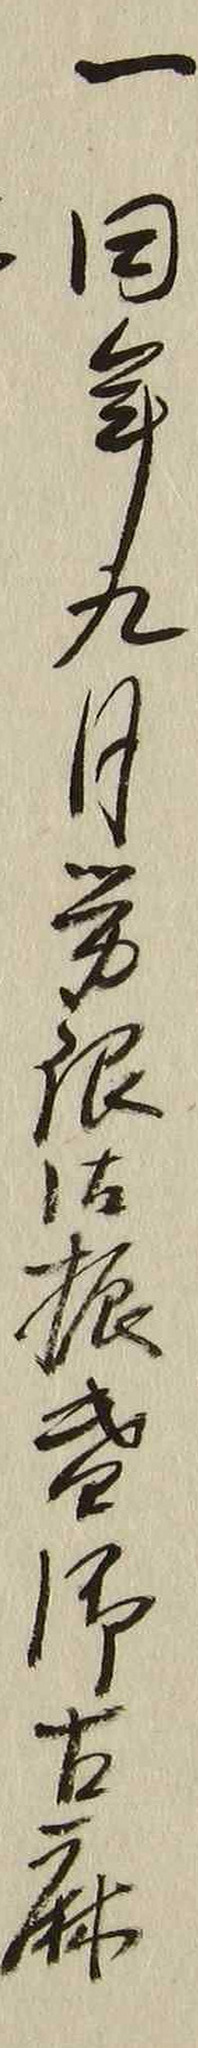一同年九月労銀御振替御古麻
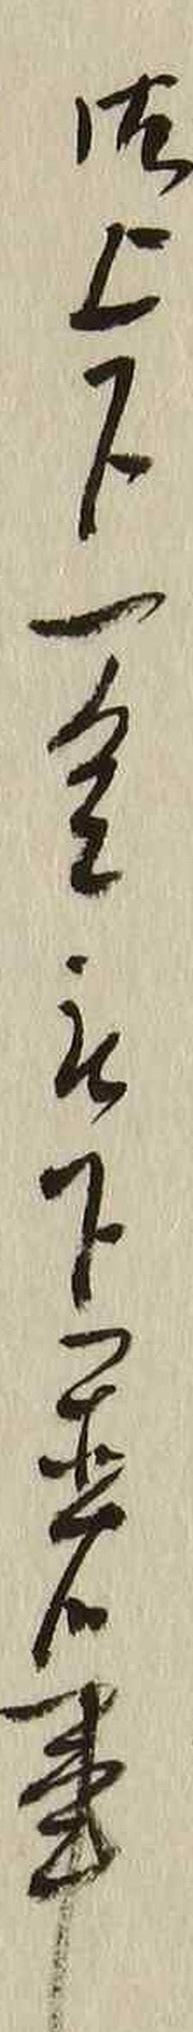御上下一具被下置候事
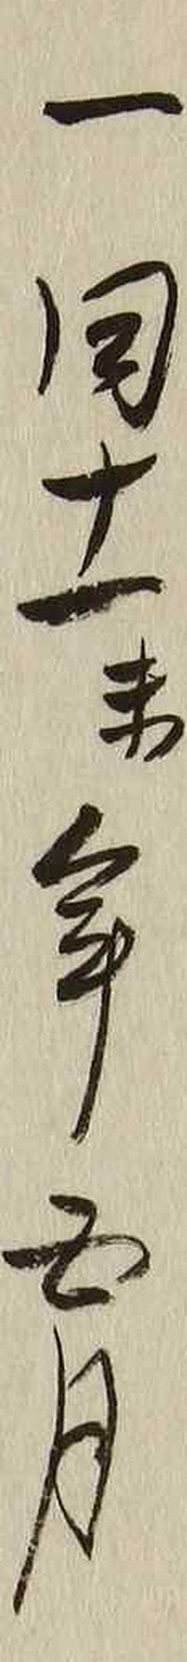一同十一未年五月
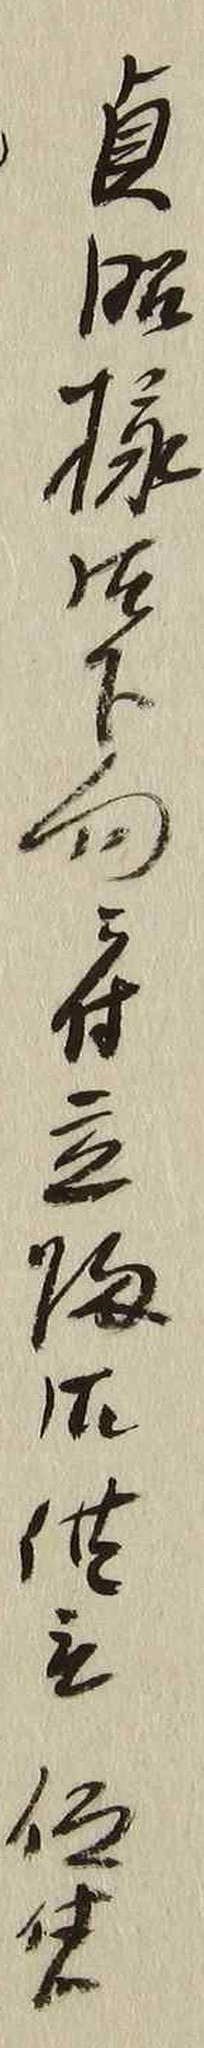貞昭様御下向ニ付立帰御供被仰付候
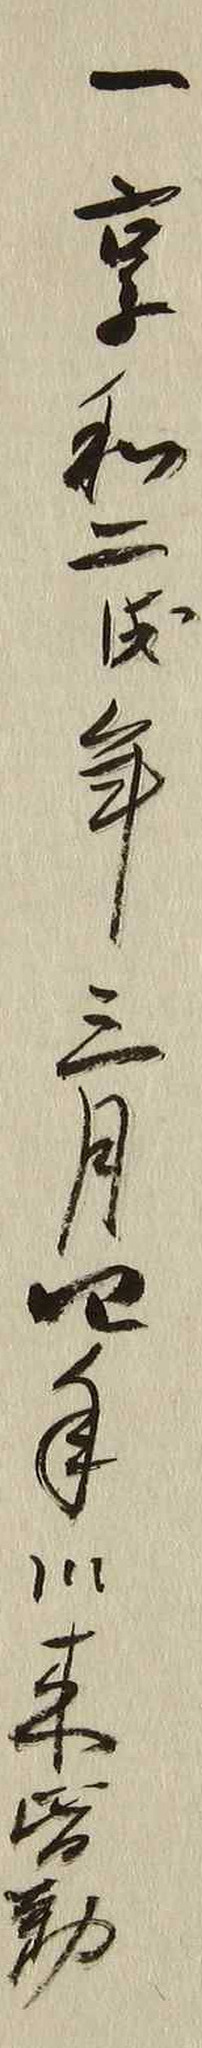一享和二戌年三月四年以来皆勤
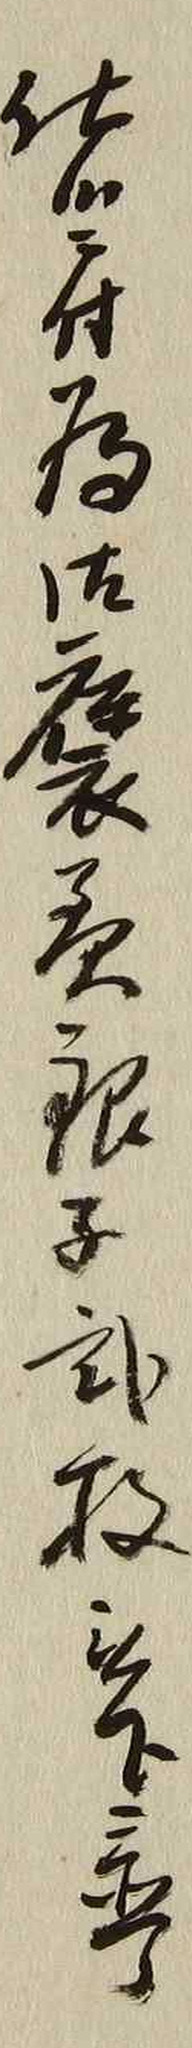仕候ニ付為御褒美銀子弐枚被下置候
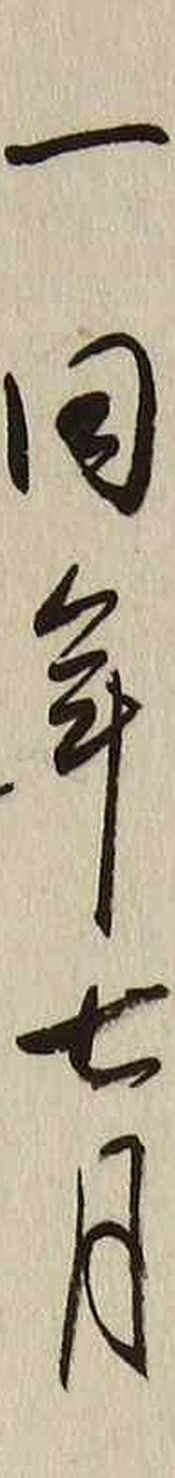一同年七月
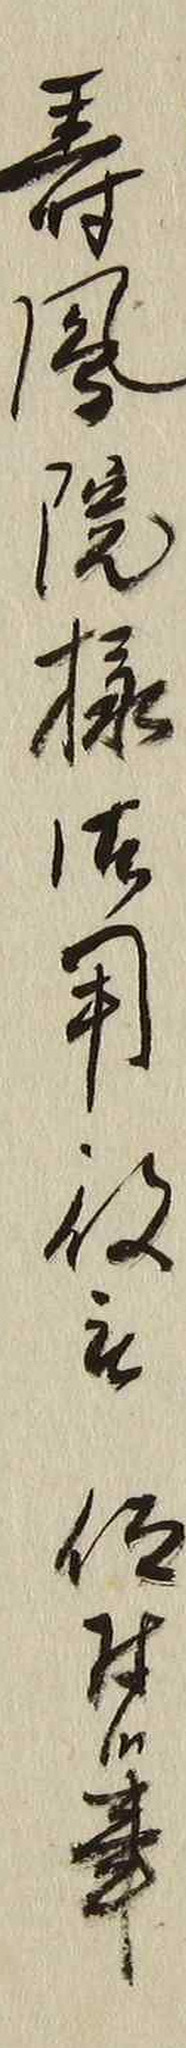寿鳳院様御用役被仰付候事
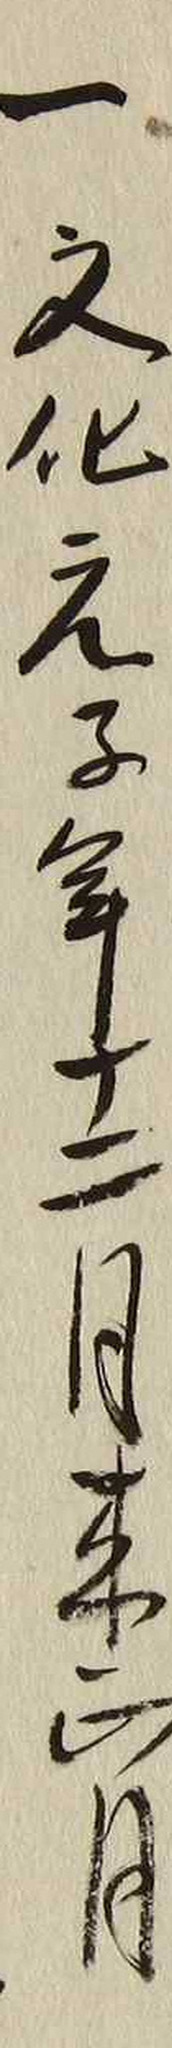一文化元子年十二月来正月
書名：諸士系譜　巻之349　も之部5
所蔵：会津若松市立会津図書館
